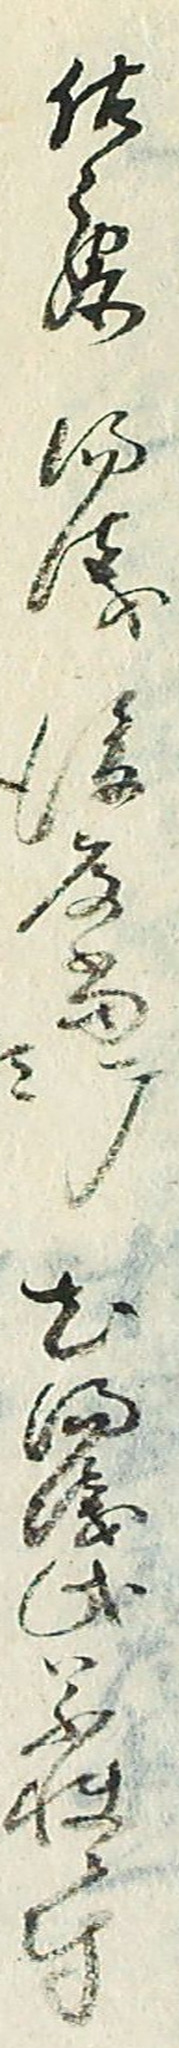佐藤湯浅後藤當テ尤湯浅氏ハ不快ニ付
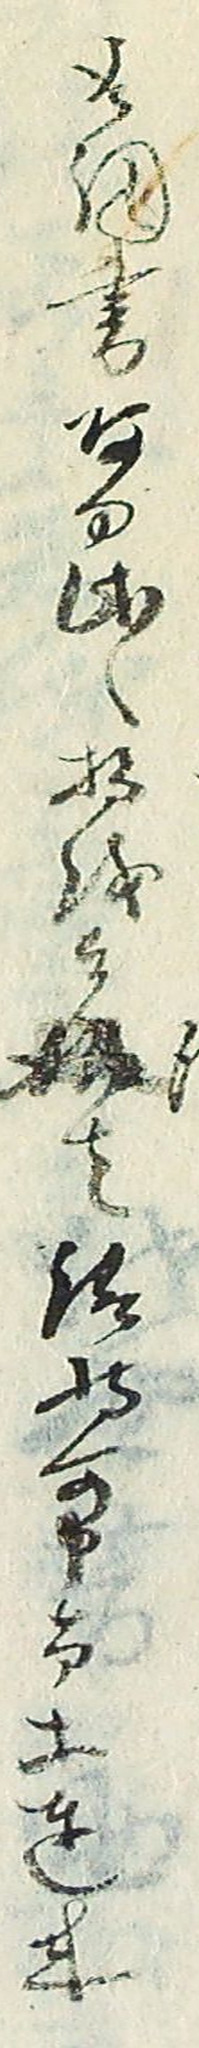取調書阿部氏へ持越候得者請持可申旨等達来
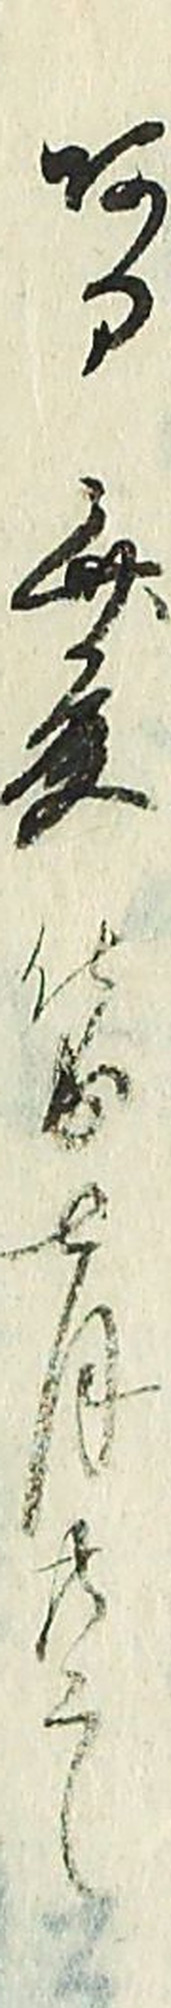阿部斎藤仕出七月廿二日
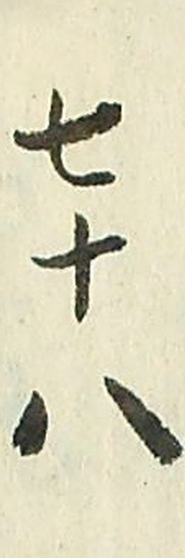七十八
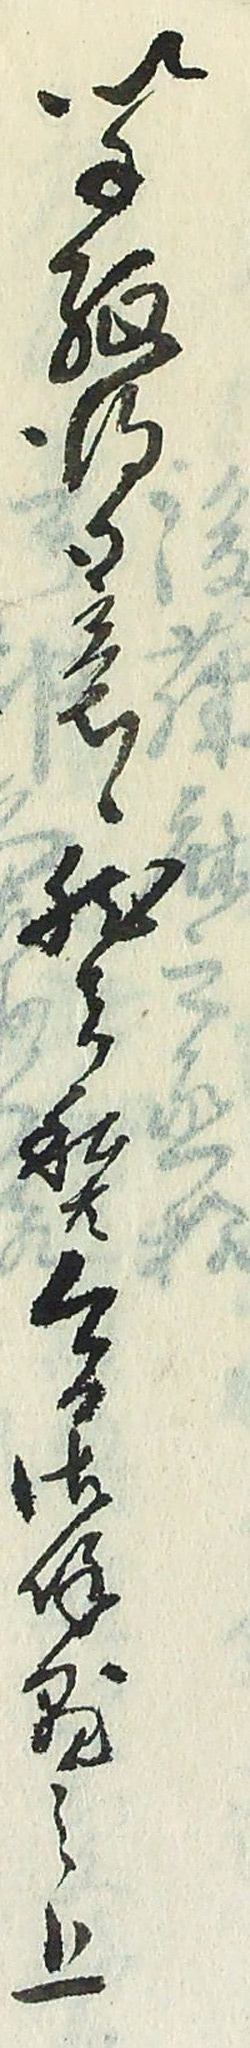以手紙得御意候然者私共今日御呼懸之上
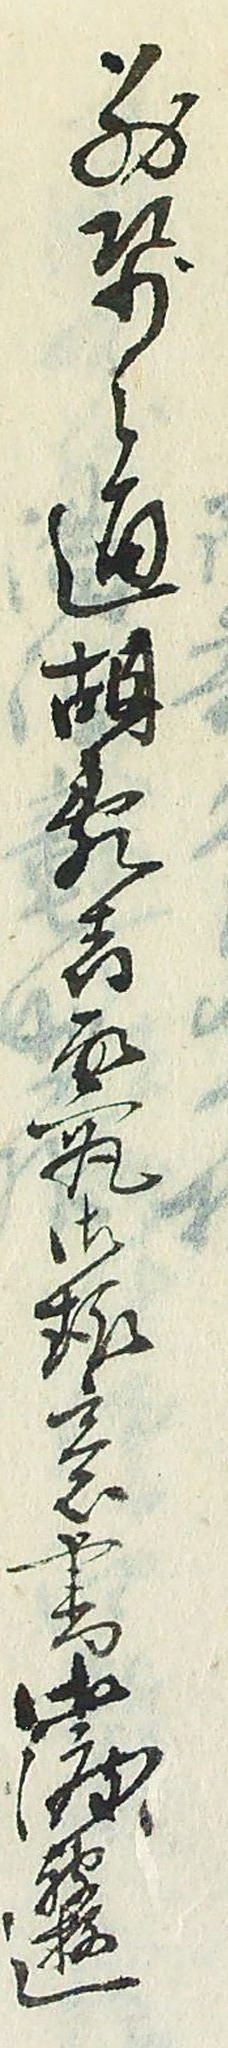別帋之通胡乱者取究御趣意書御渡被遊
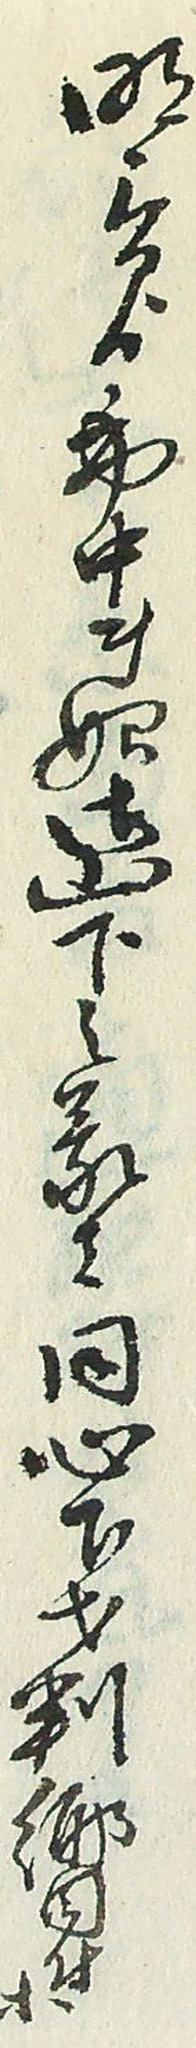明三日ゟ市中ヲ始御山下之義者同心下才判郷目付等
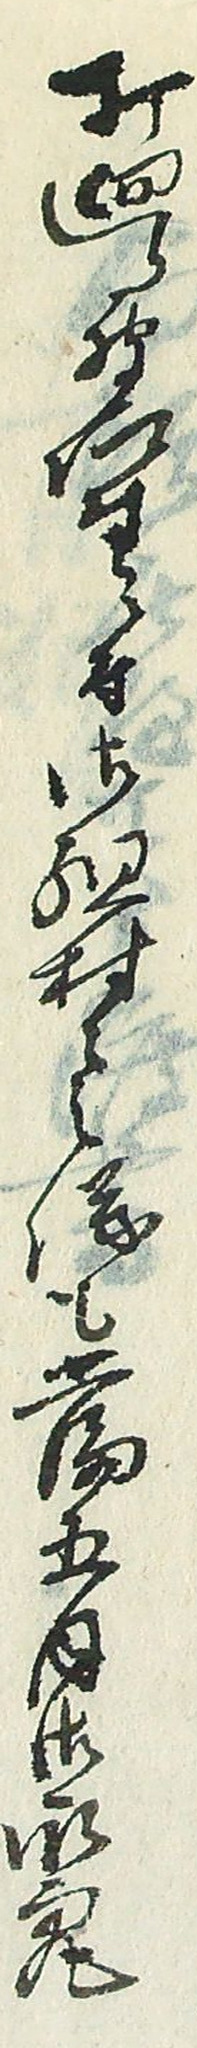打廻り被仰付ニ付御組村々之儀も當五月御取究
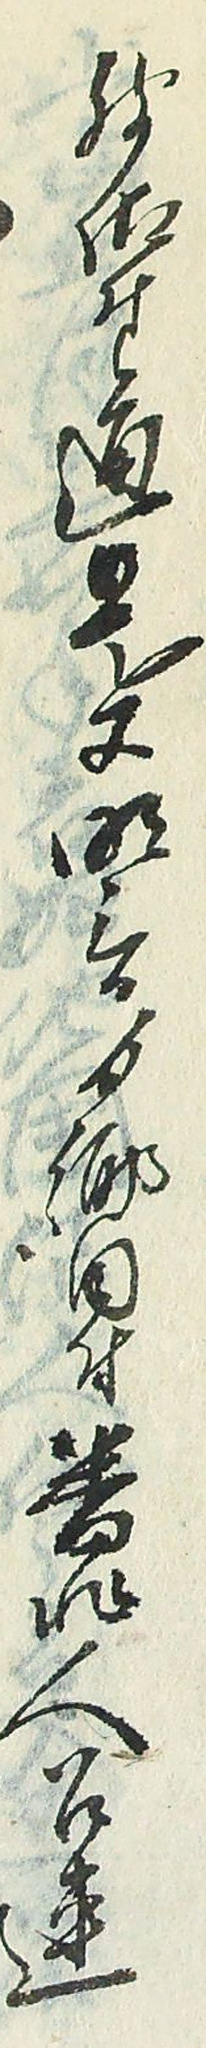被仰付候通是又明三日ゟ郷目付番非人召連
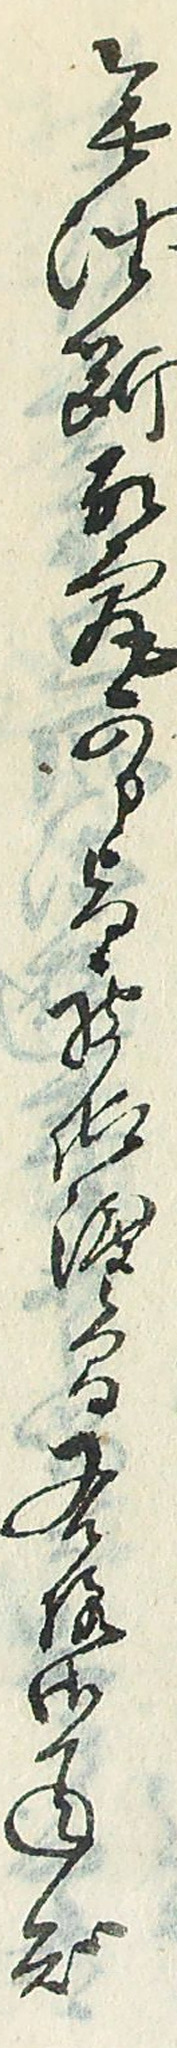無油断取究可申旨被仰渡候間右様御承知
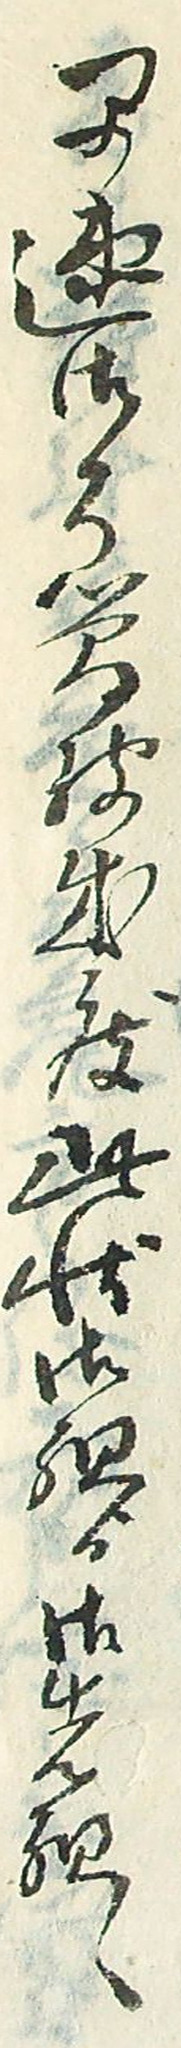早速御了簡被成度此状御組ゟ御先組へ

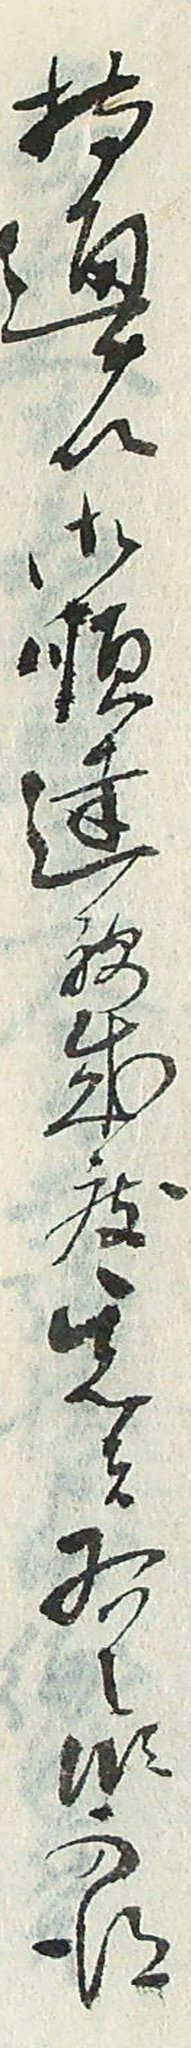持通ヲ以御順達被成度候先者右之段可得
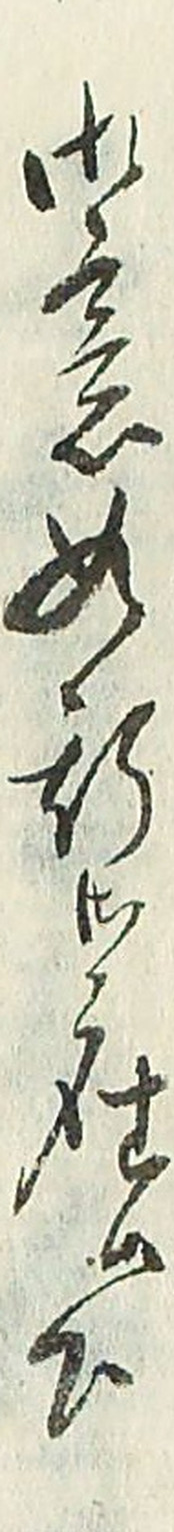御意如斯御座候以上
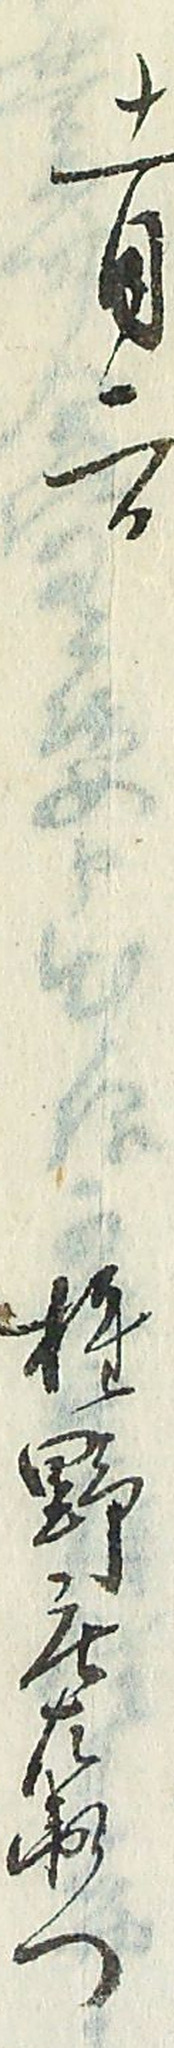十一月二日鈴江徳右衛門
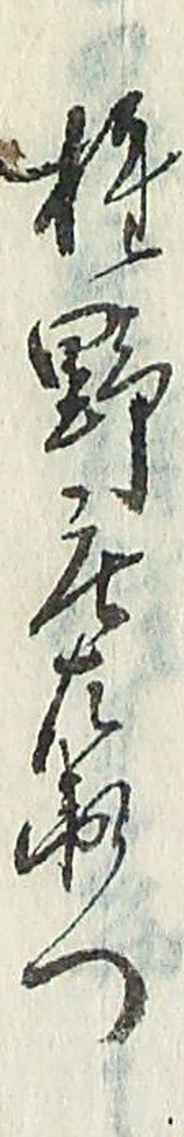権野庄左衛門
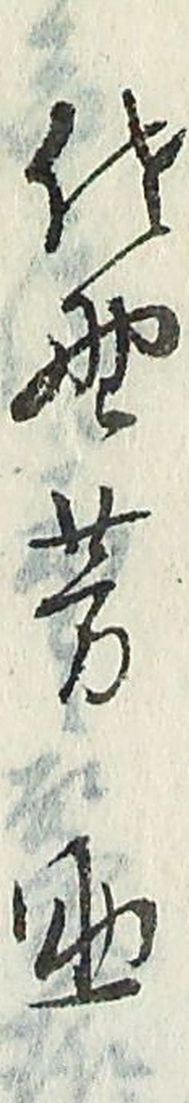佐野芳助
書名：諸御趣意書并御下知向之写
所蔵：鳴門教育大学 Naruto University of Education
